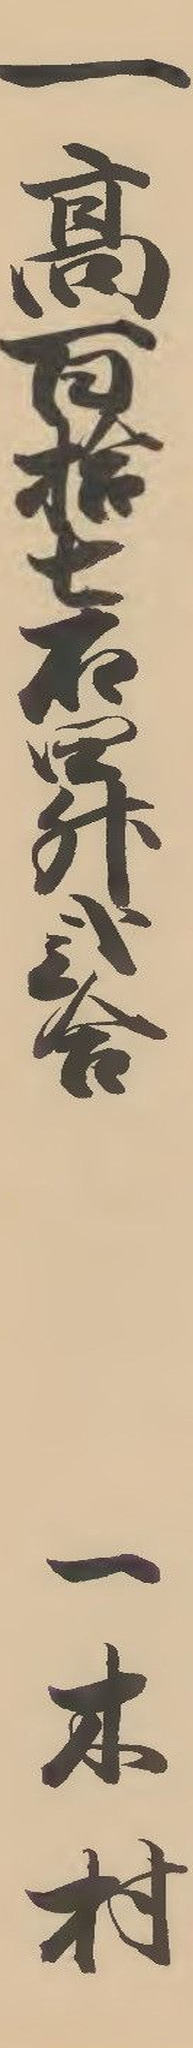一髙百拾七石四升弐合一木村

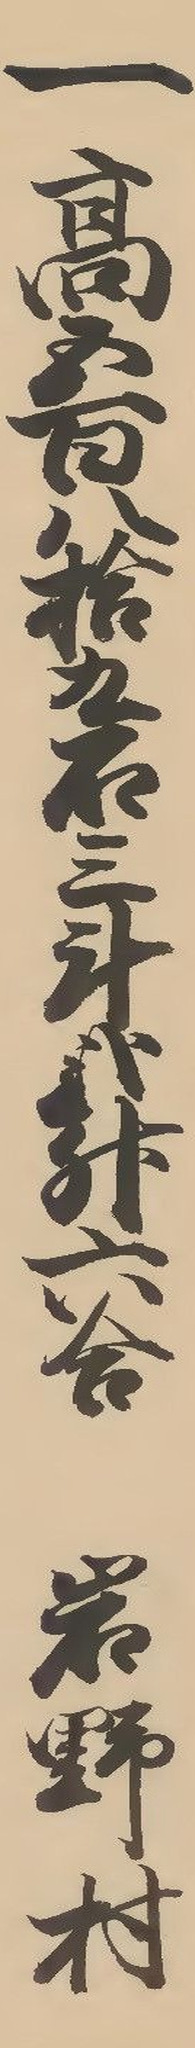一髙五百八拾九石三斗弐升六合岩野村
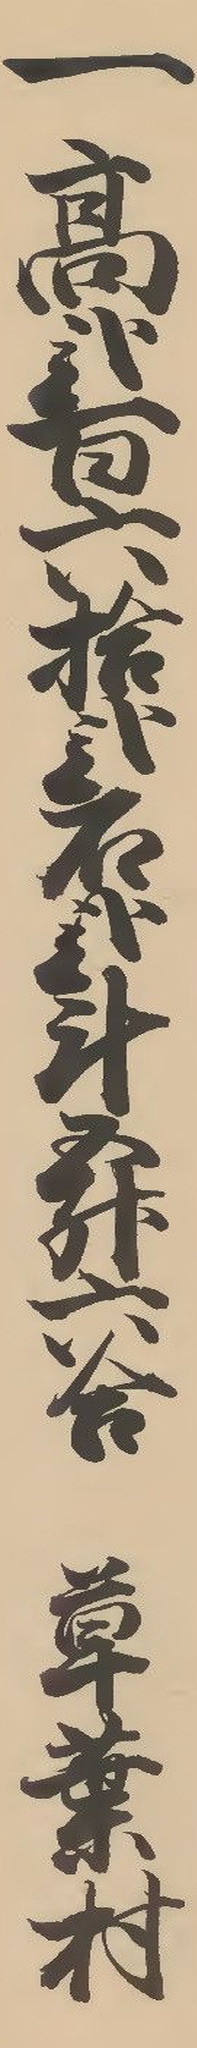一髙弐百六拾弐石弐斗五升六合草場村
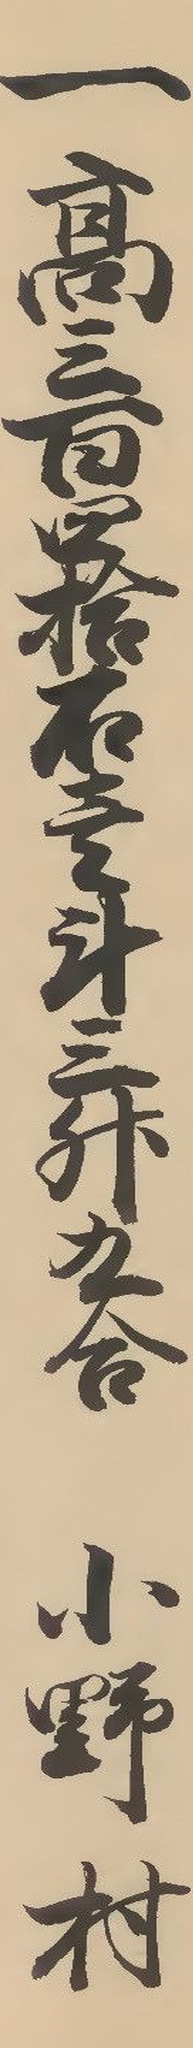一髙三百四拾石壱斗三升九合小野村
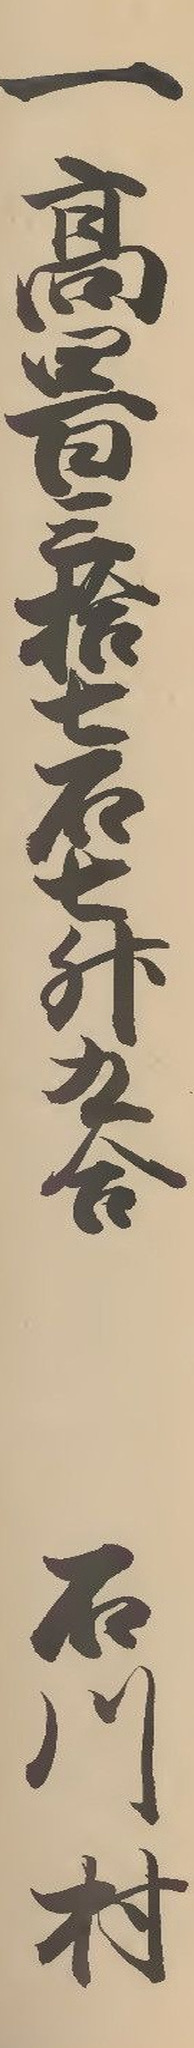一髙四百三拾七石七升九合石川村
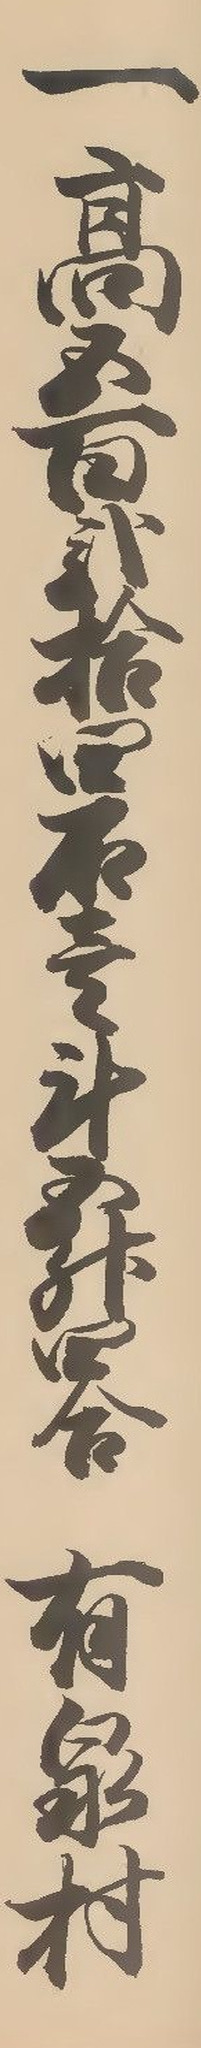一髙五百弐拾四石壱斗五升四合有泉村
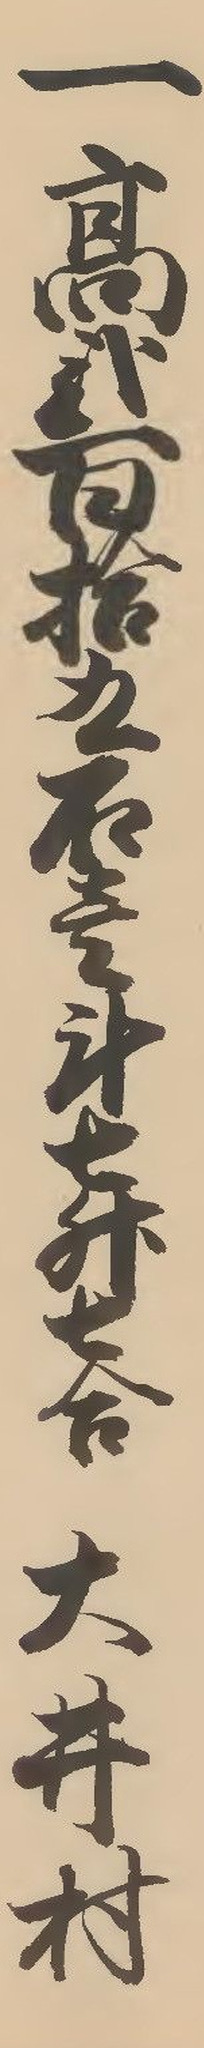一髙弐百拾九石壱斗七升七合大井村
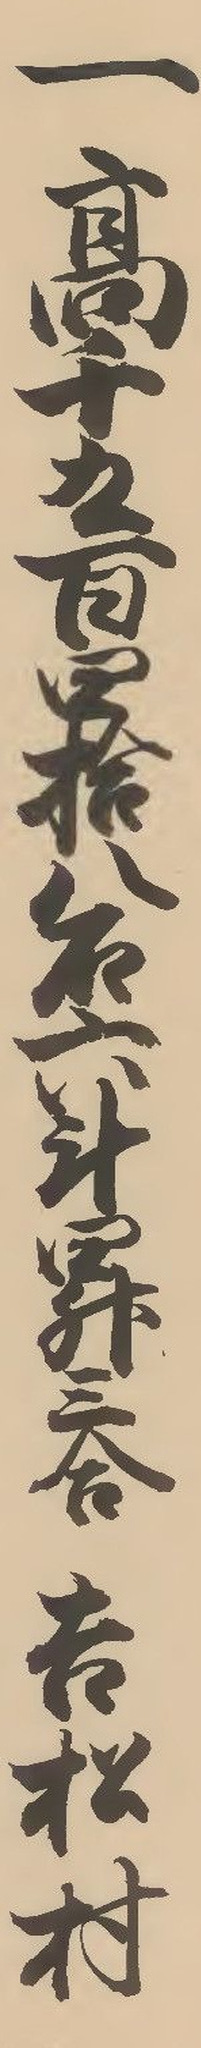一髙千九百四拾八石六斗四升三合吉松村
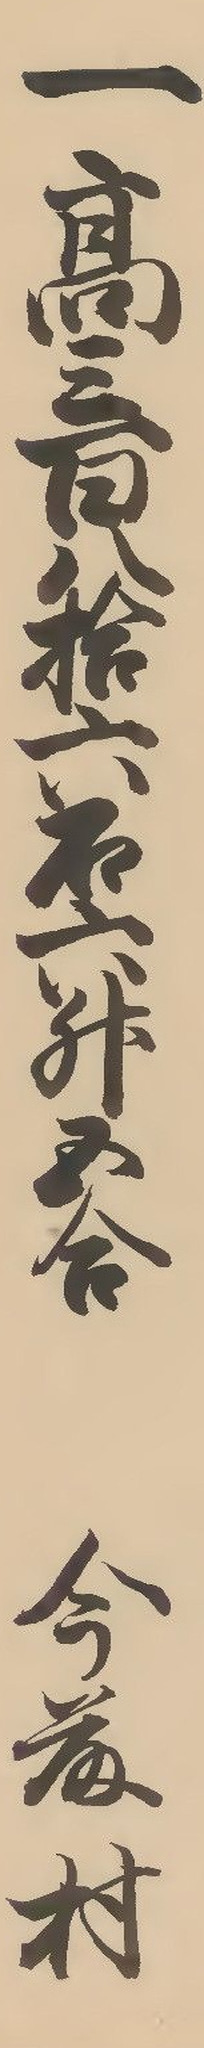一髙三百八拾六石六升五合今藤村

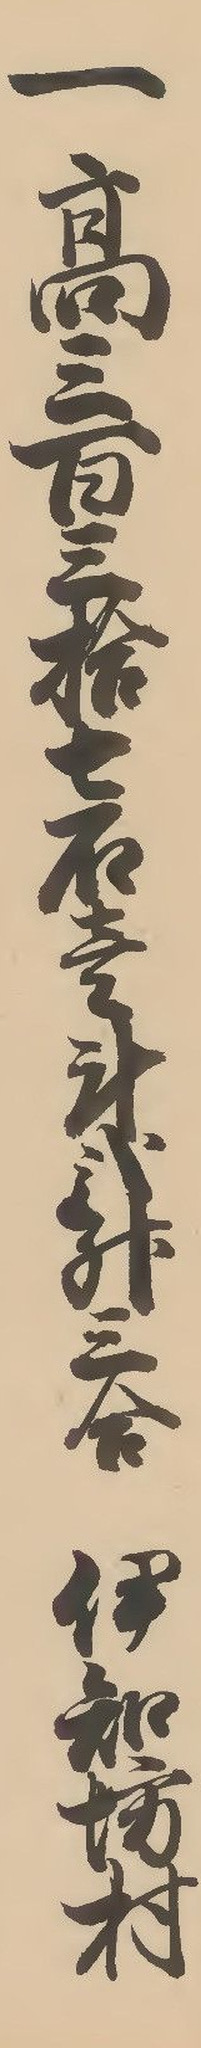一髙三百三拾七石壱斗弐升三合伊知坊村
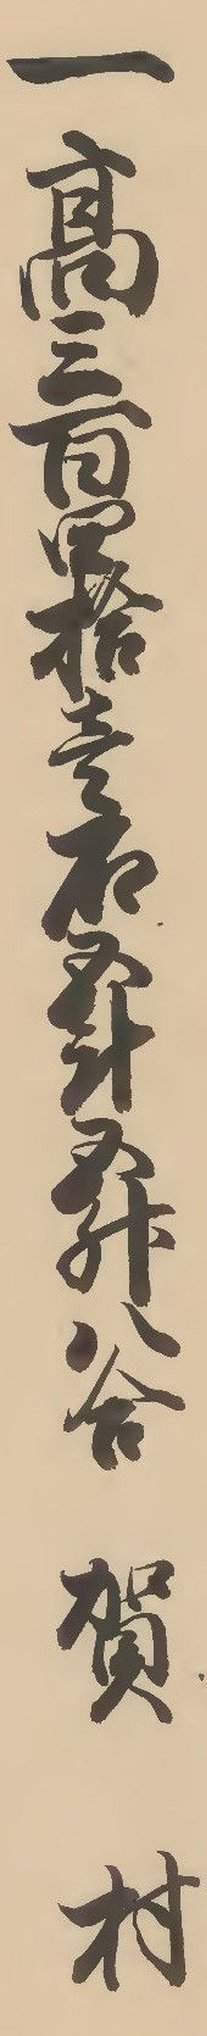一髙三百四拾壱石五斗五升八合賀村
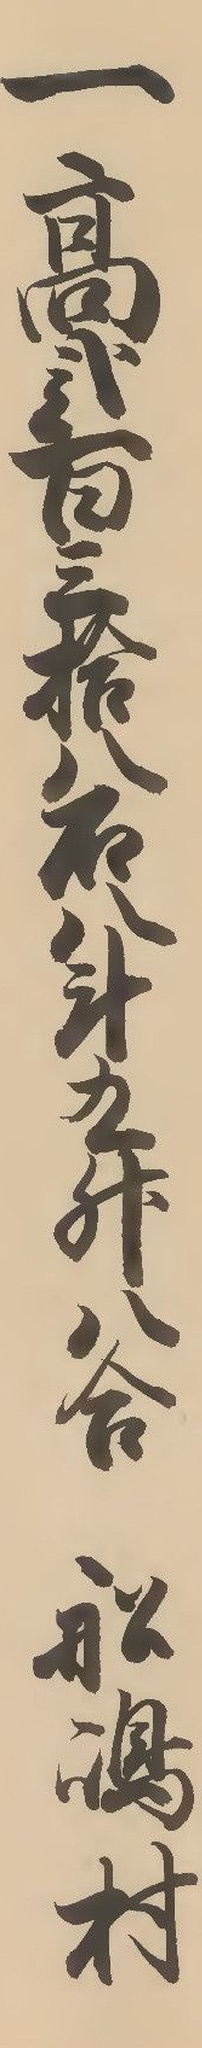一髙弐百三拾八石八斗九升八合舩嶋村
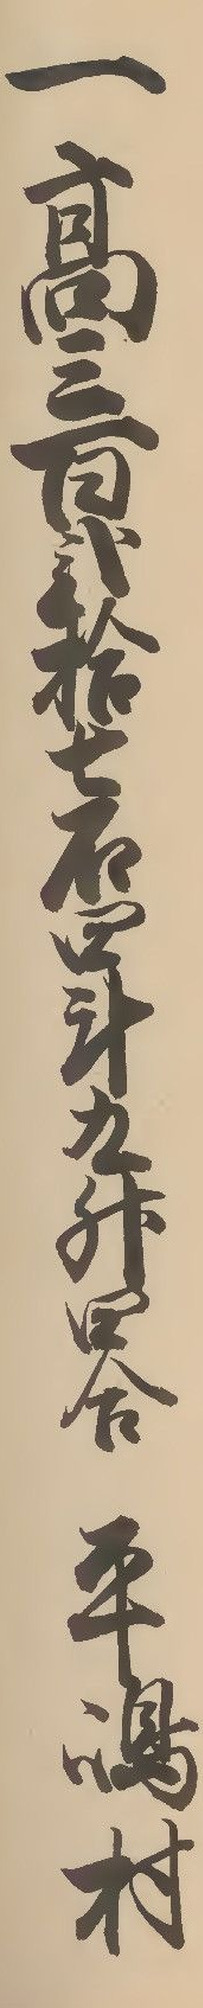一髙三百弐拾七石四斗九升四合平嶋村
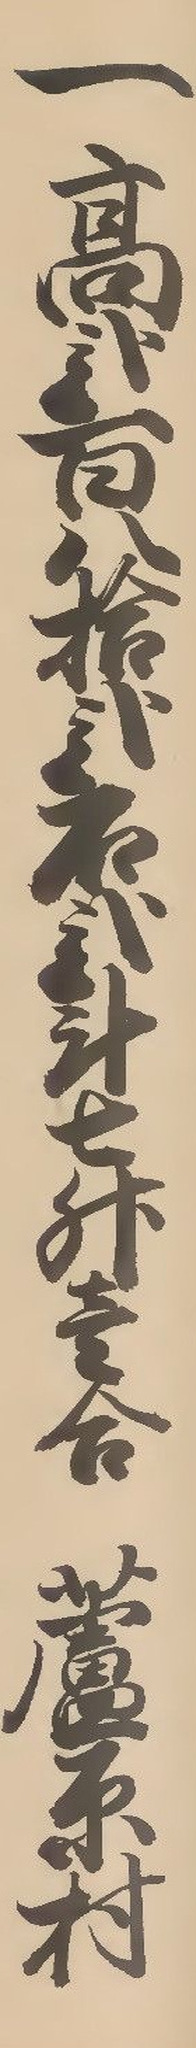一髙弐百八拾弐石弐斗七升壱合蘆原村
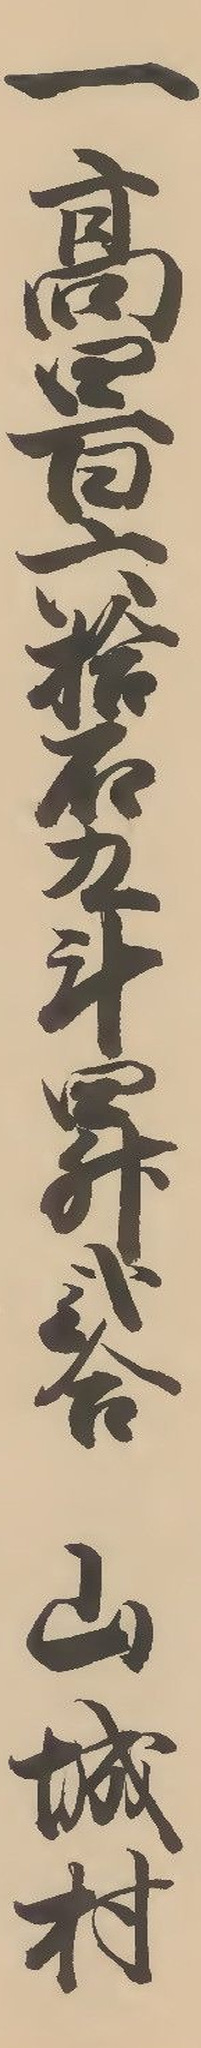一髙四百六拾石九斗四升弐合山城村
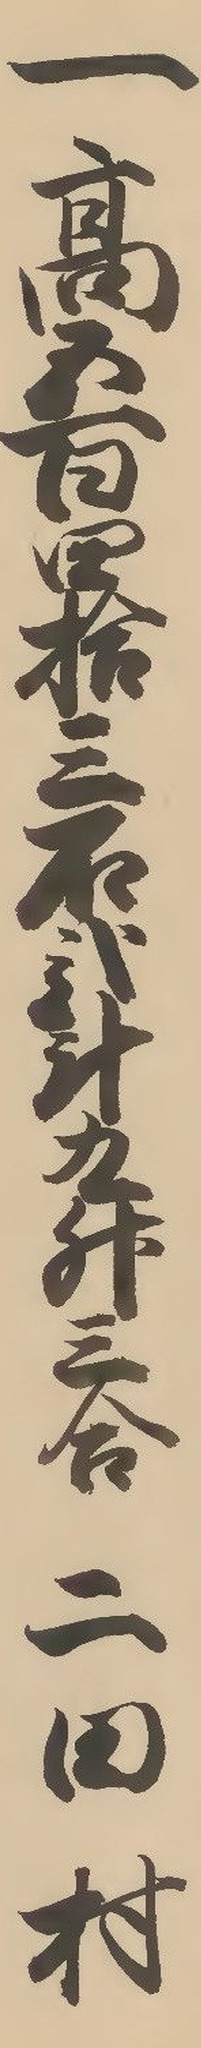一髙五百四拾三石弐斗九升三合二田村
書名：肥後国郷帳
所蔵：国立公文書館 National Archives of Japan
